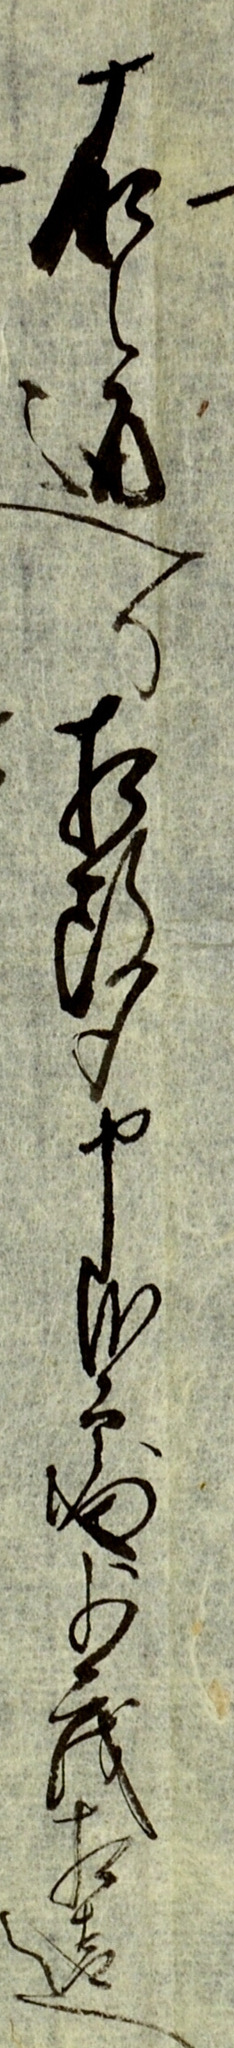右之通り相改メ申候処少も相違
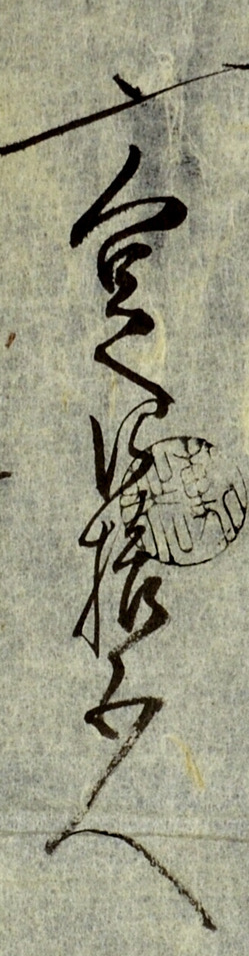〆人足四拾五人
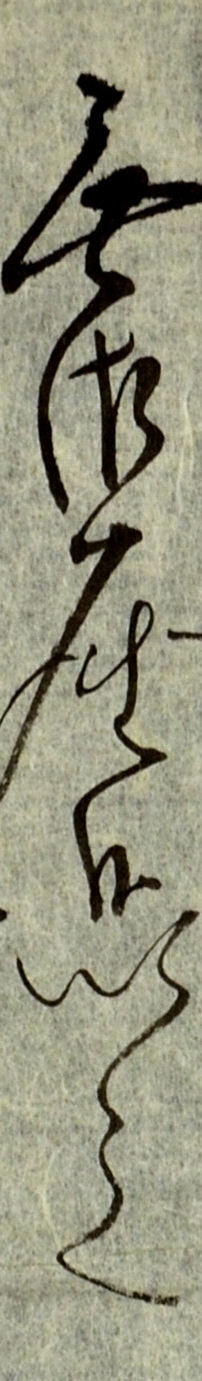無御座候以上
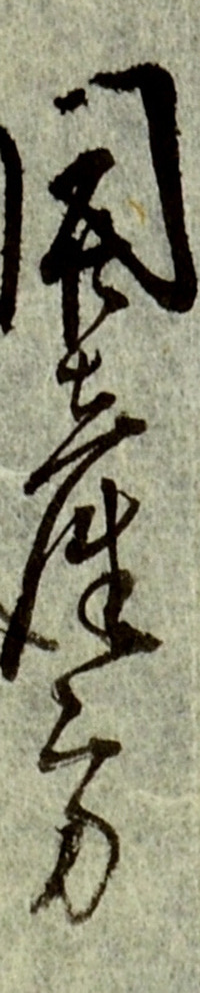開産方
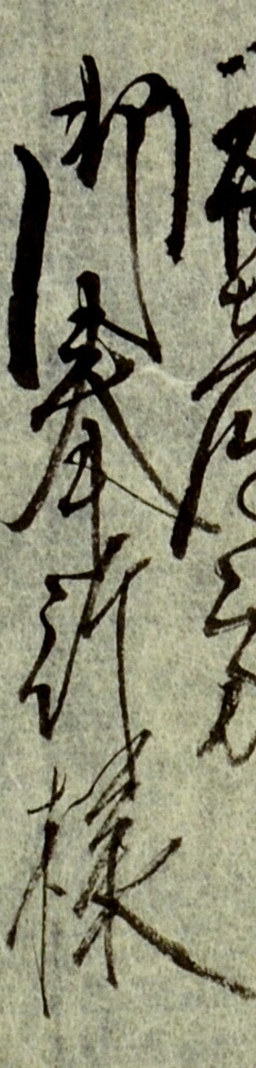御奉行様
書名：覚
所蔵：伊那市立高遠町図書館・合同会社AMANE
